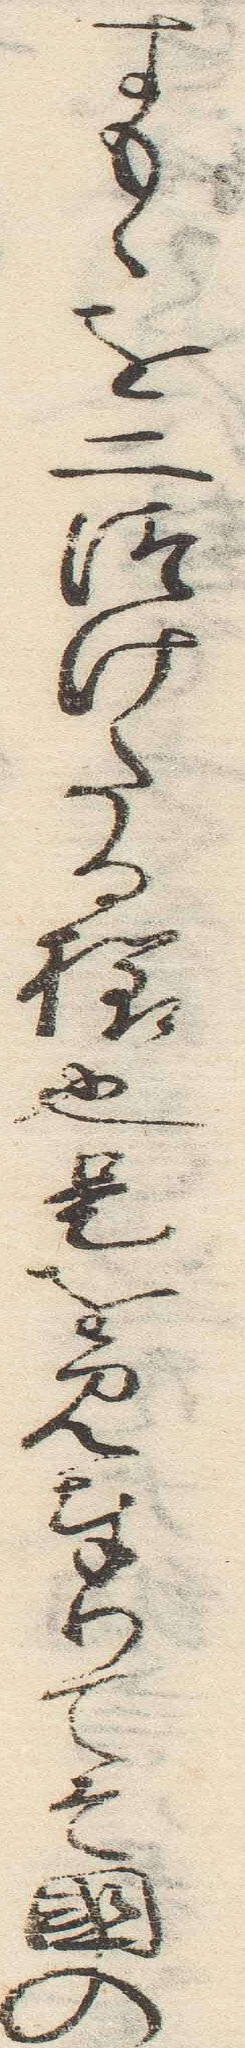すもゝを二つけたる様也是を見奉りてそ国の
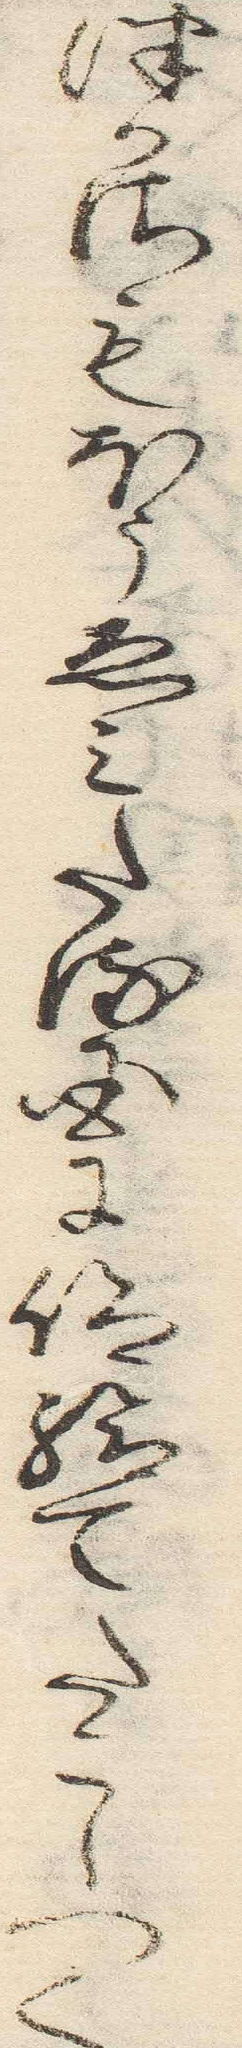つかさもほうゑみたる国に仰給てたこしつく
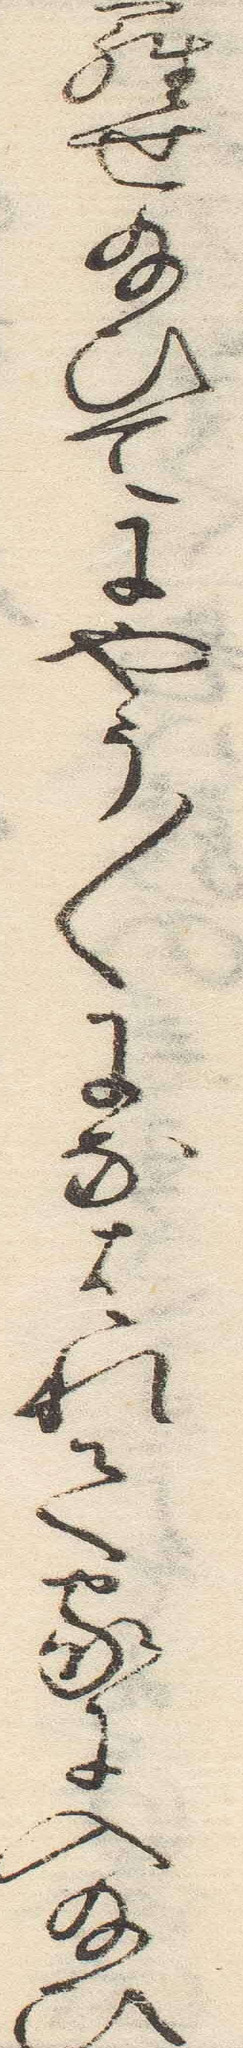らせ給ひてやう〳〵になはれて家に入給ひ
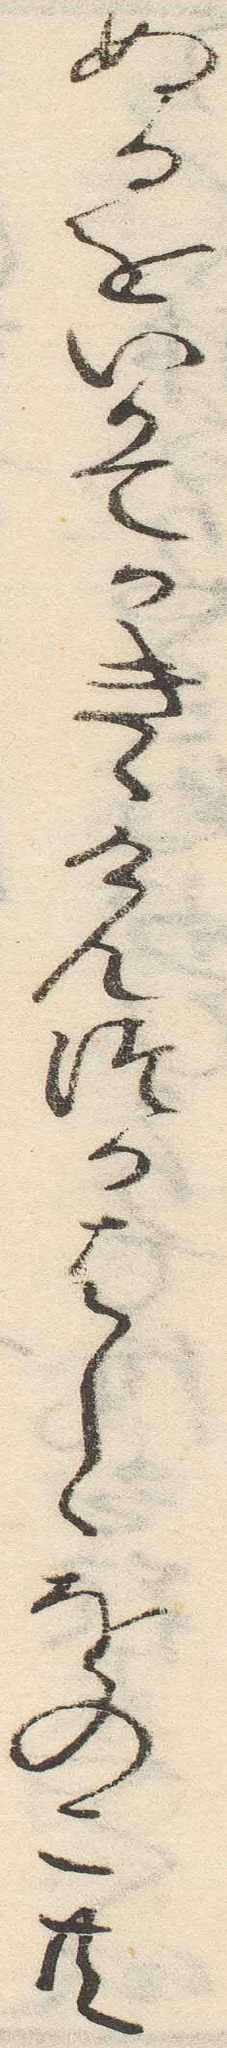ぬるをいりてかきゝけんつかはしゝをのこ共
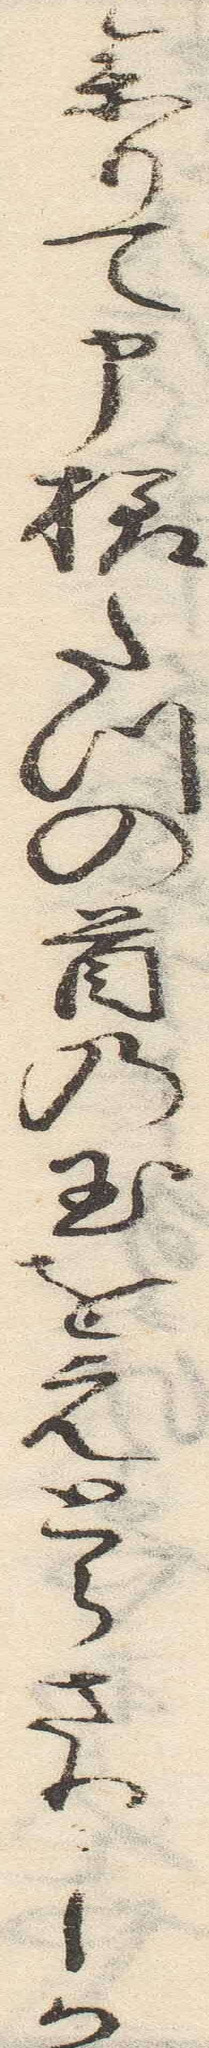参りて申様たつの首の玉をえとらさりしか
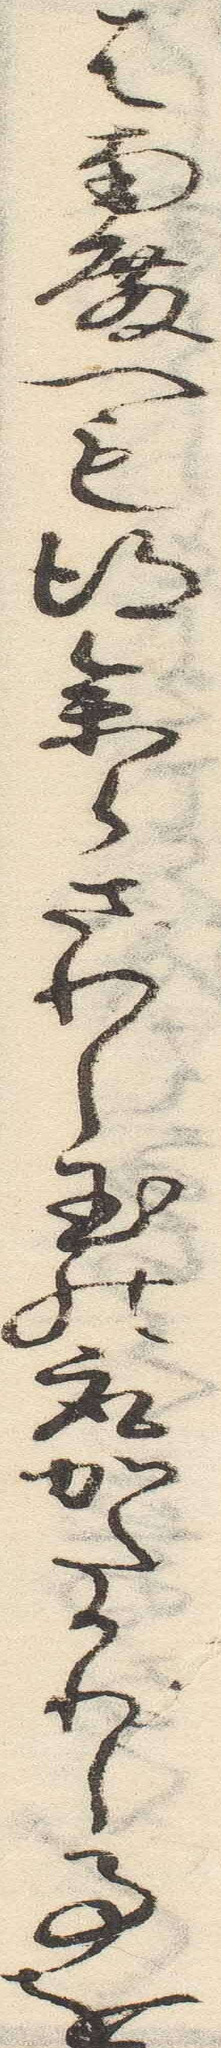は南殿へも得参らさりし玉の取かたかりし事を
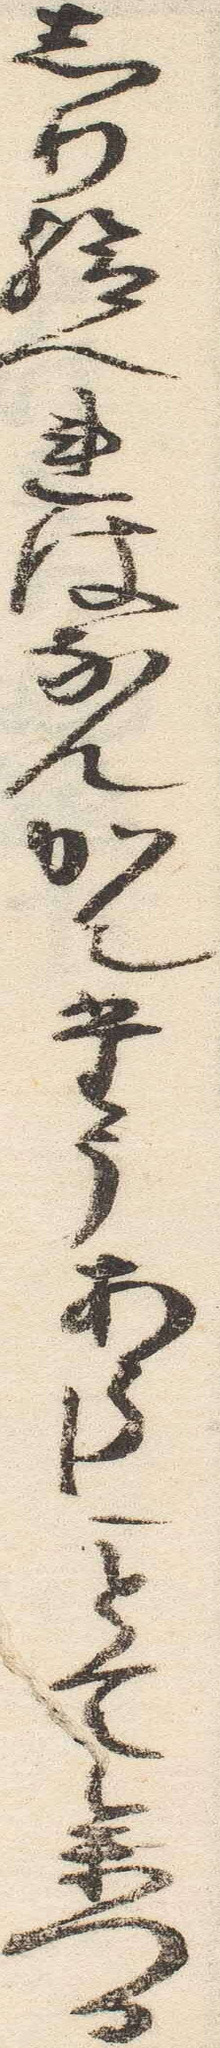しり給へれはなんかんたうあらしとて参つる
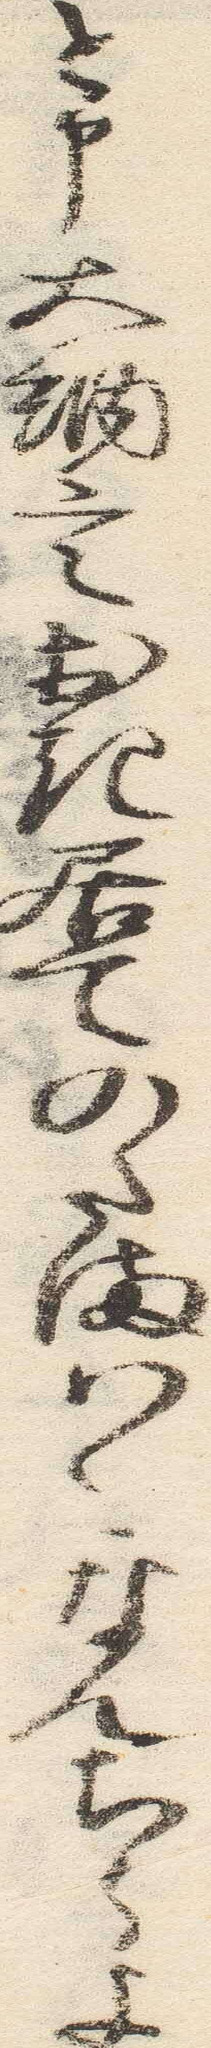と申大納言おき居てのたまはくなんちらよ
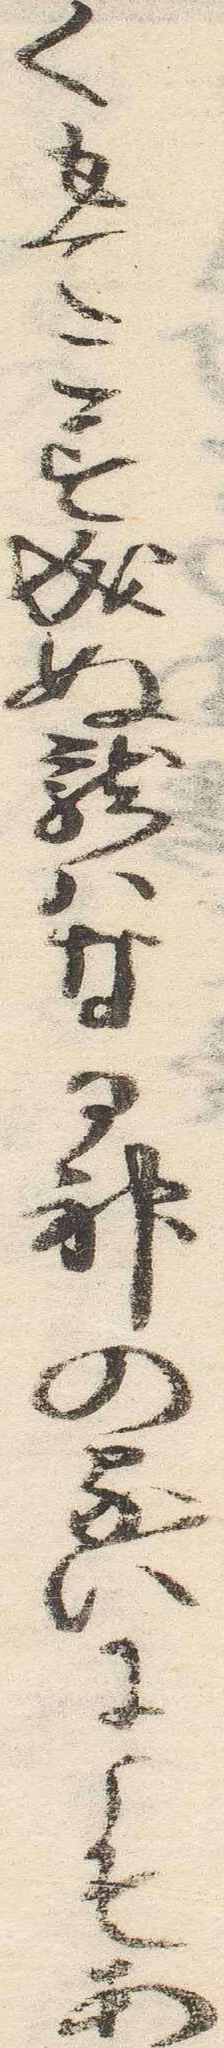くもてこす成ぬ龍はなる神のるいにこそあ
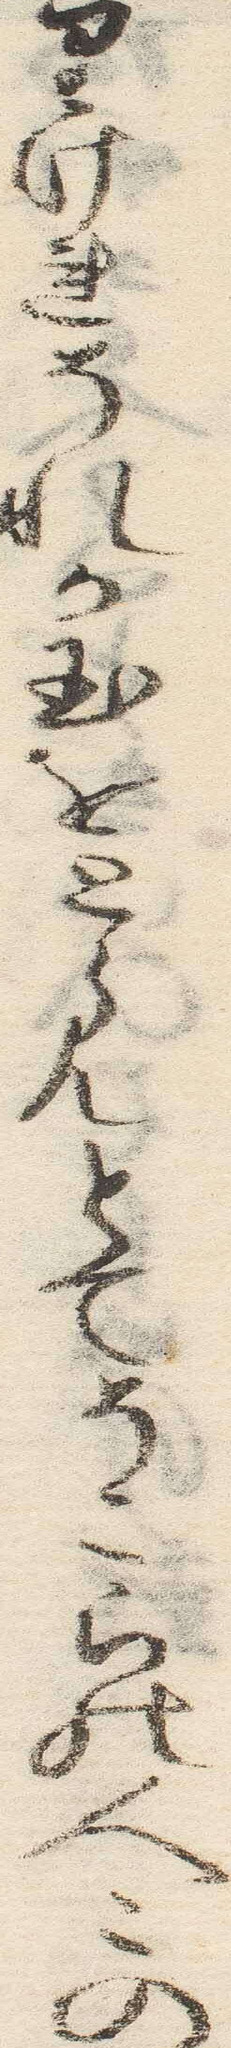りけれそれか玉をとらんとてそこらの人々の
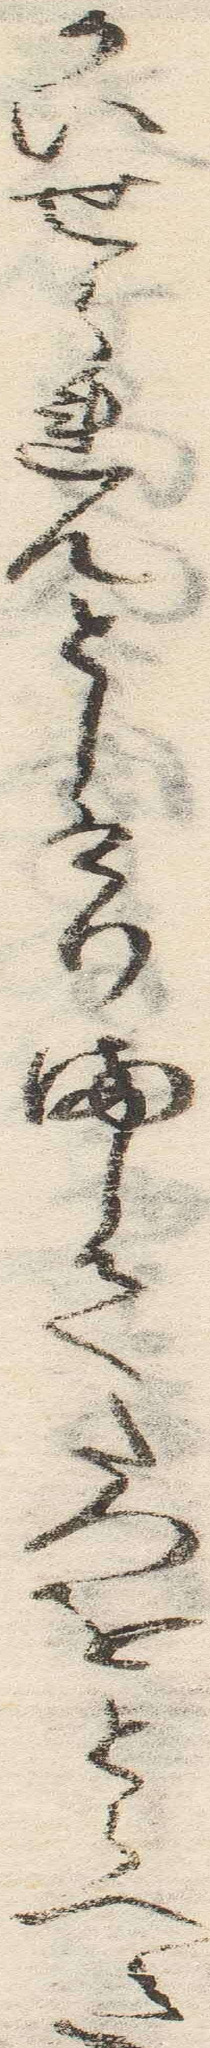かいせられんとしけりましてたつをとらへた
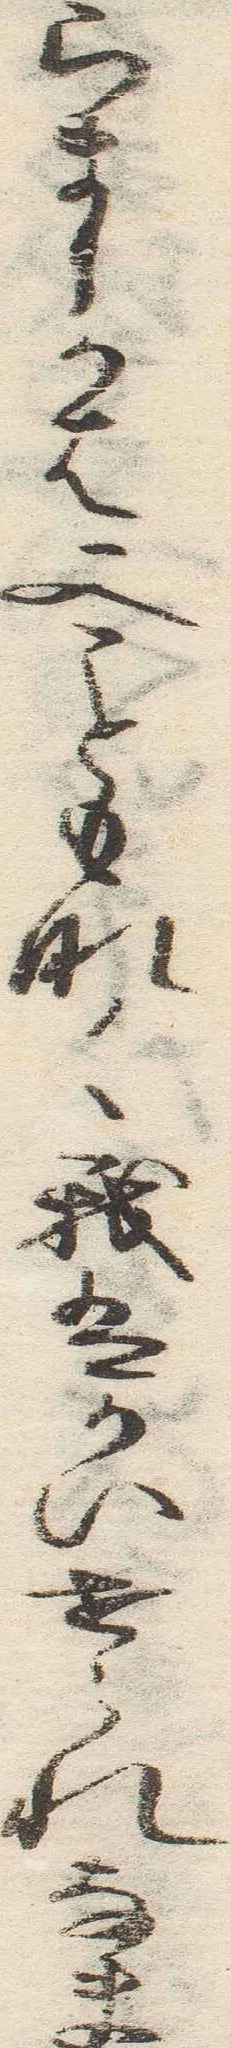らましかは又こともなく我はかいせられなま
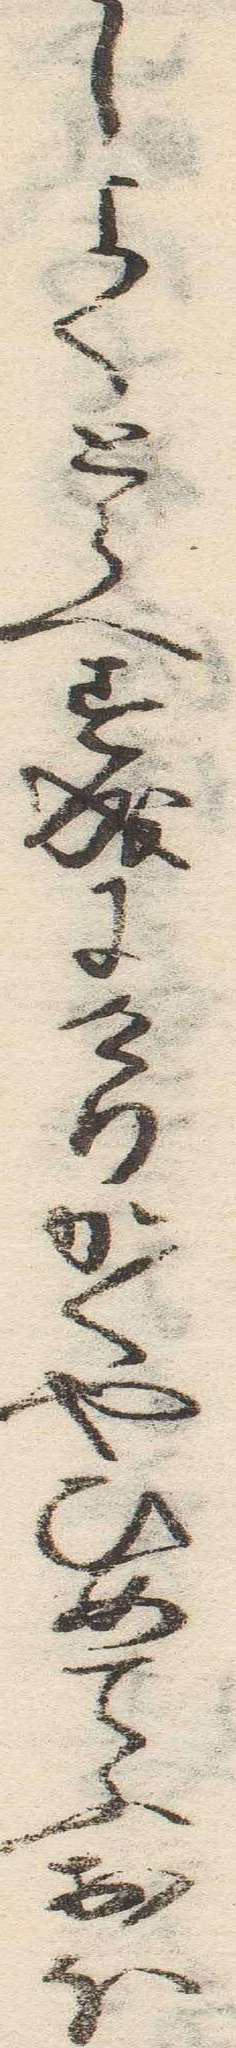しよくとらへす成にけりかくやひめてふおほ
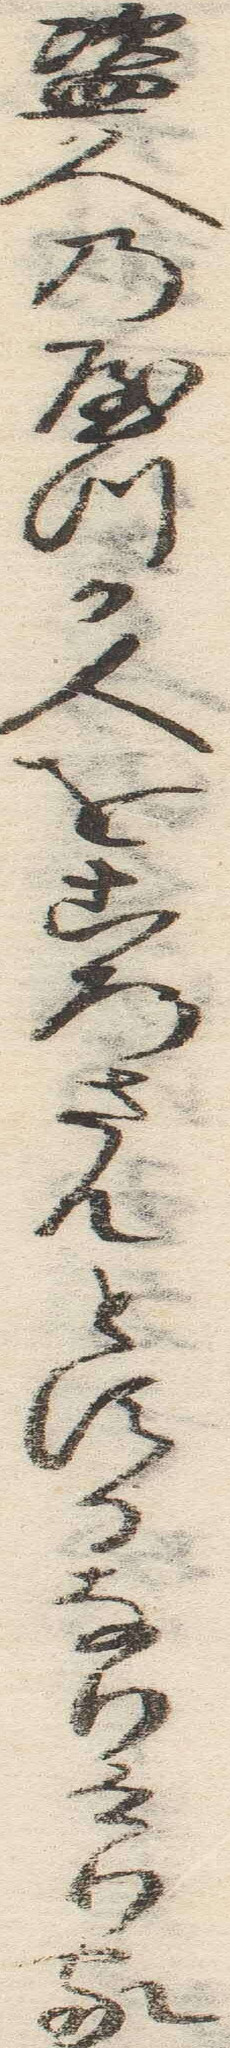盗人のやつか人をころさんとするなりけり家
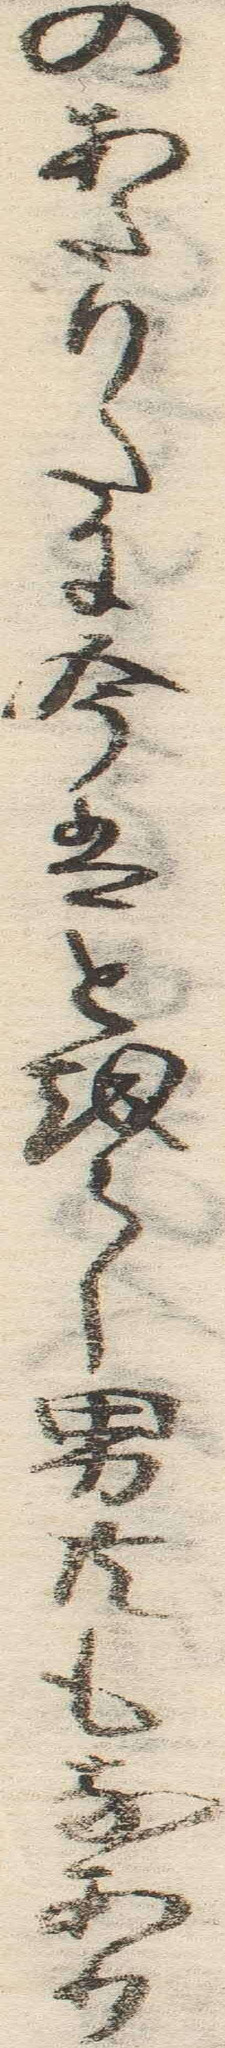のあたりたに今はとをらし男共もなあり
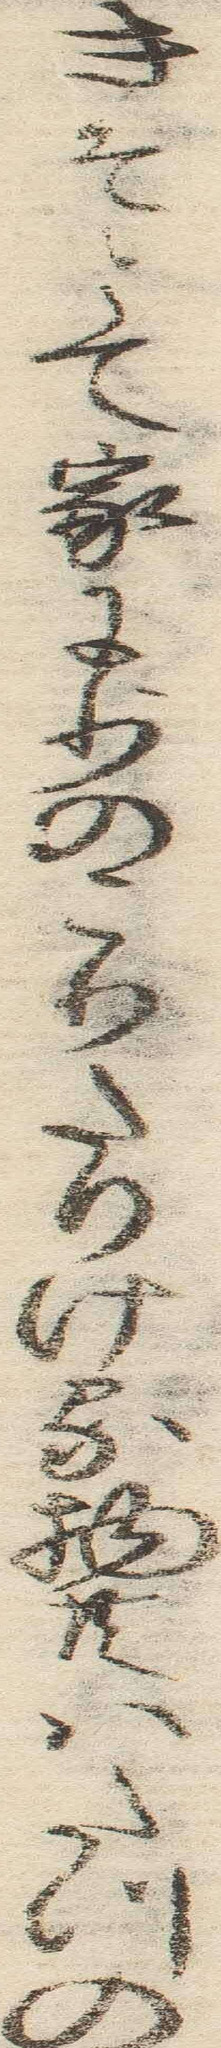きそとて家に少のこりたりける物共はたつの
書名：竹取物語
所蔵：東京学芸大学附属図書館 国文学研究資料館
